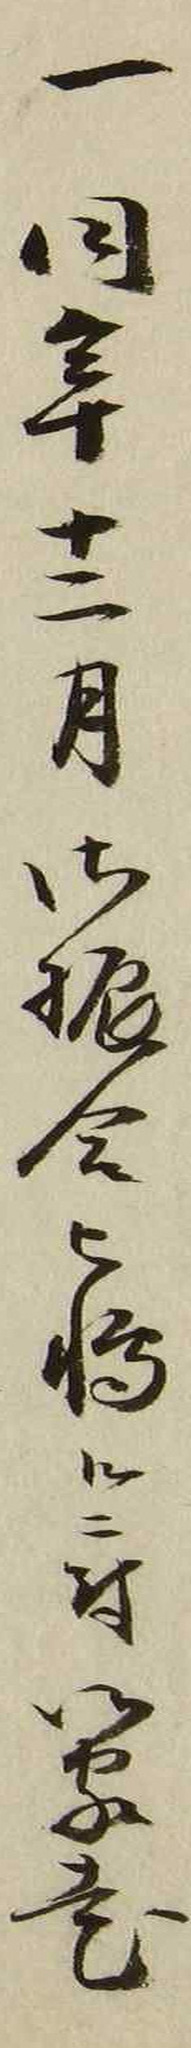一同年十二月御振合被転候ニ付御家老
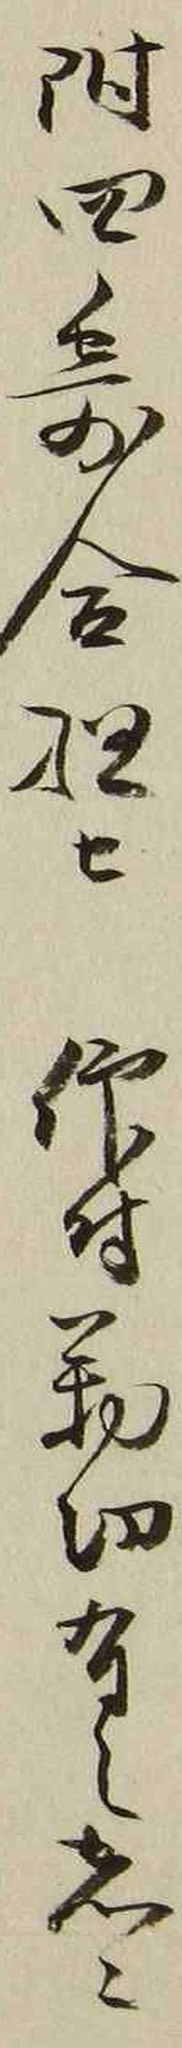附四ノ寄合組被仰付勤功有之者ニ
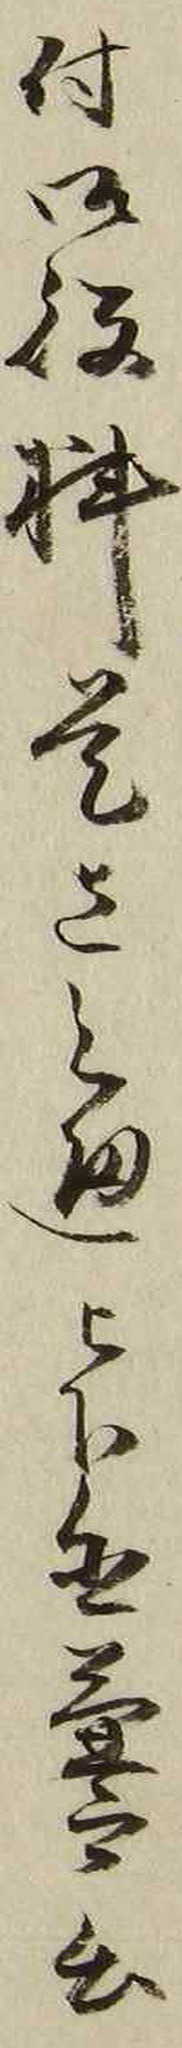付御役料是迄之通被下置兼而出
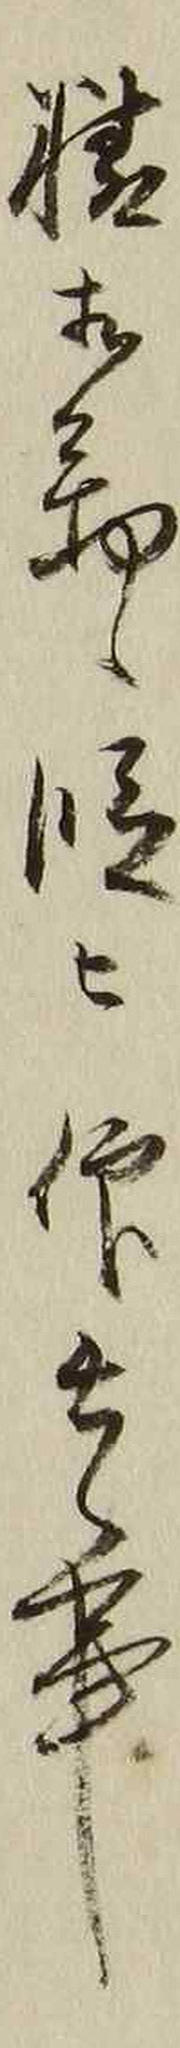精相勤候段被仰出候事
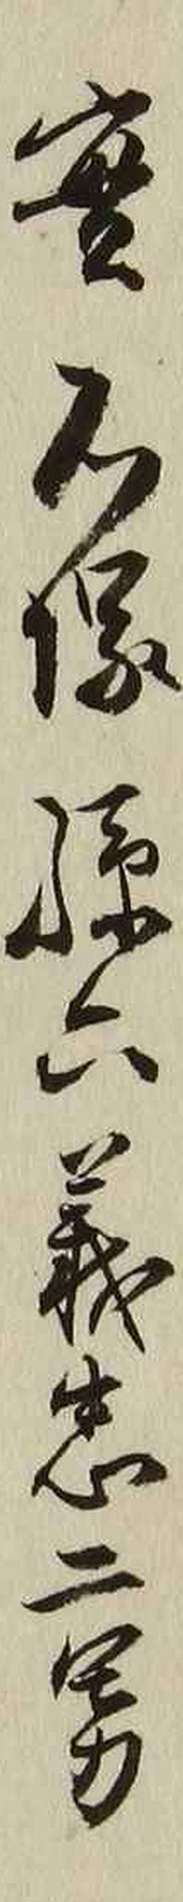実石塚孫六義志二男
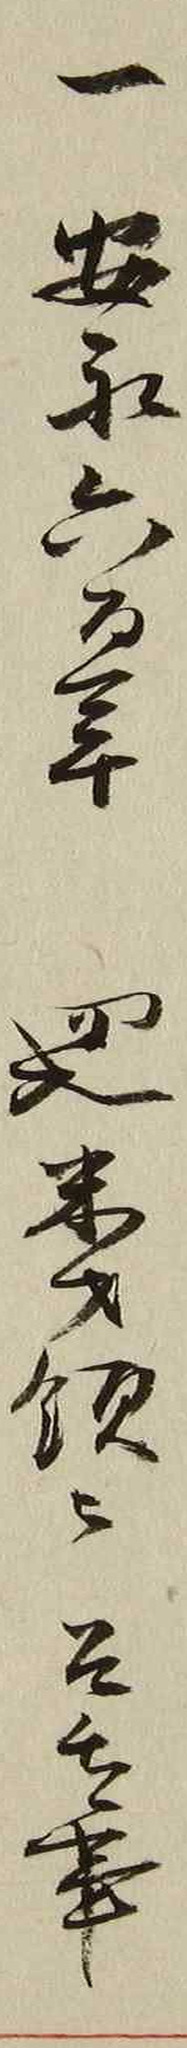一安永六酉年廻米才領被召出候事
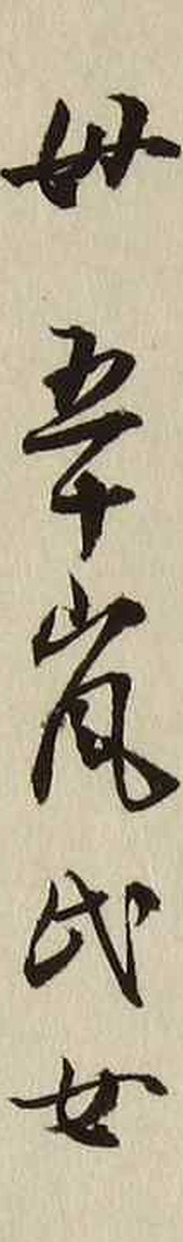母五十嵐氏女
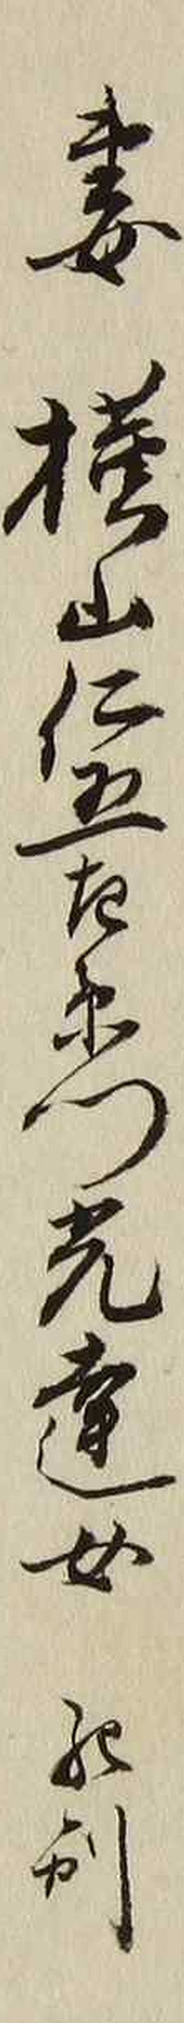妻横山仁五左衛門光達女死別
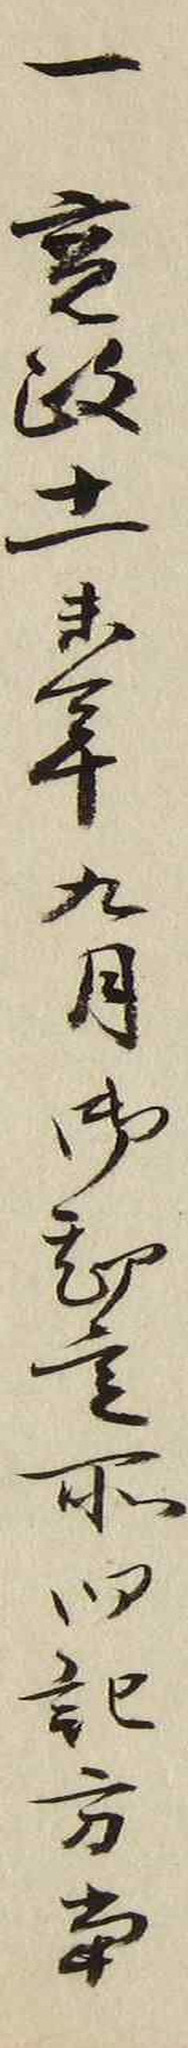一寛政十一未年九月御勘定所旧記方当
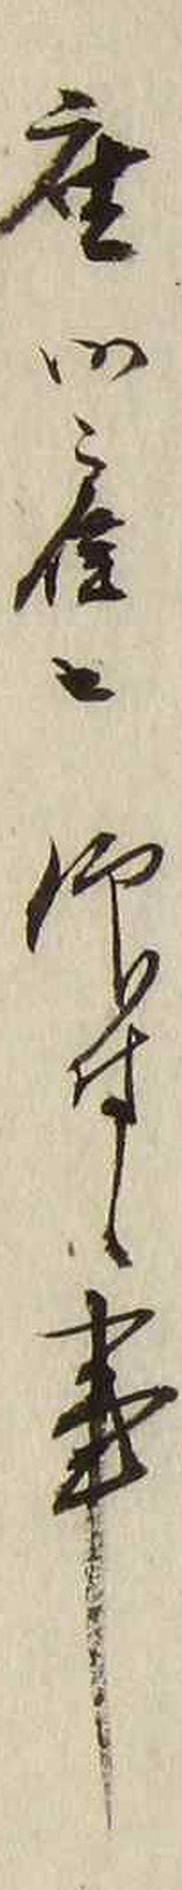座御雇被仰付候事

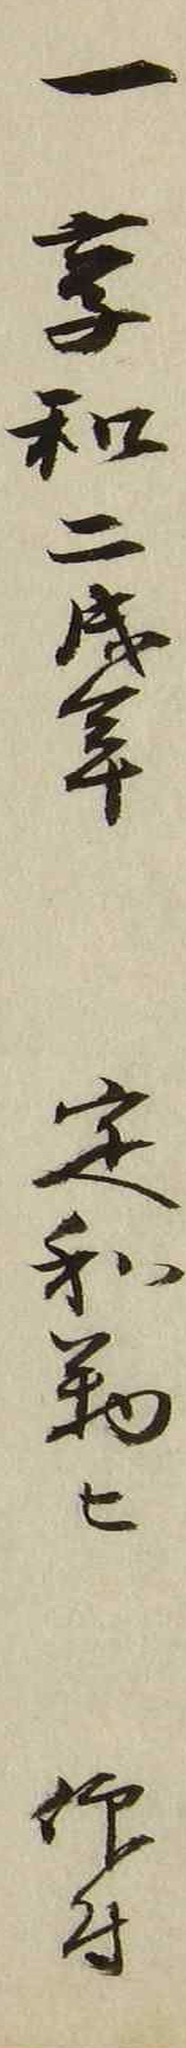一享和二戌年定和勤被仰付
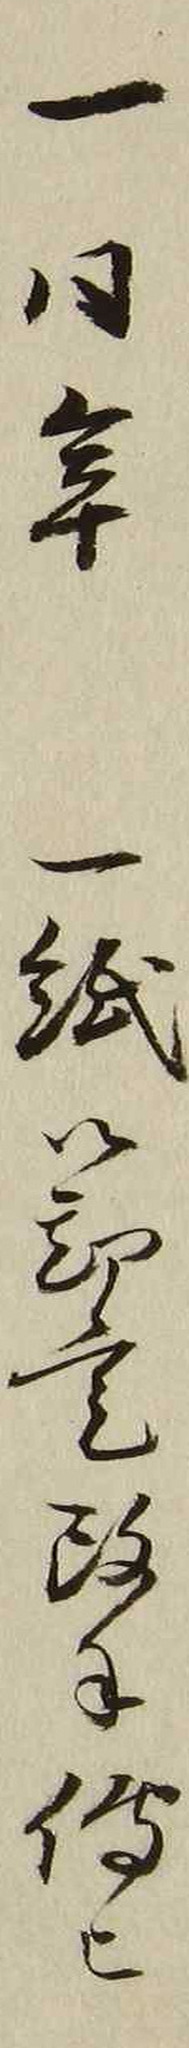一同年一紙御勘定改手伝被
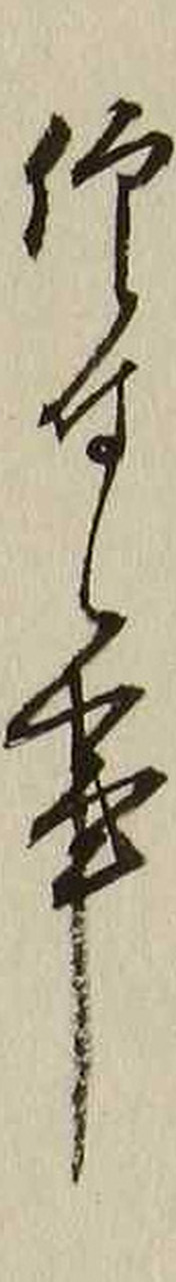仰付候事
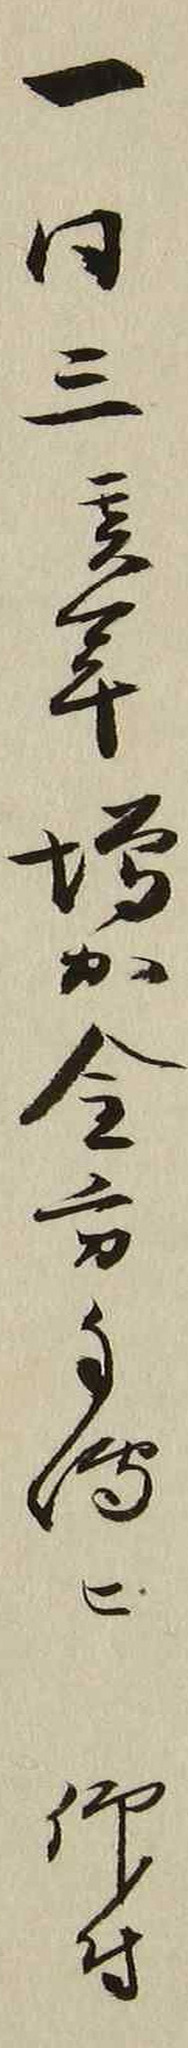一同三亥年増加金方手伝被仰付
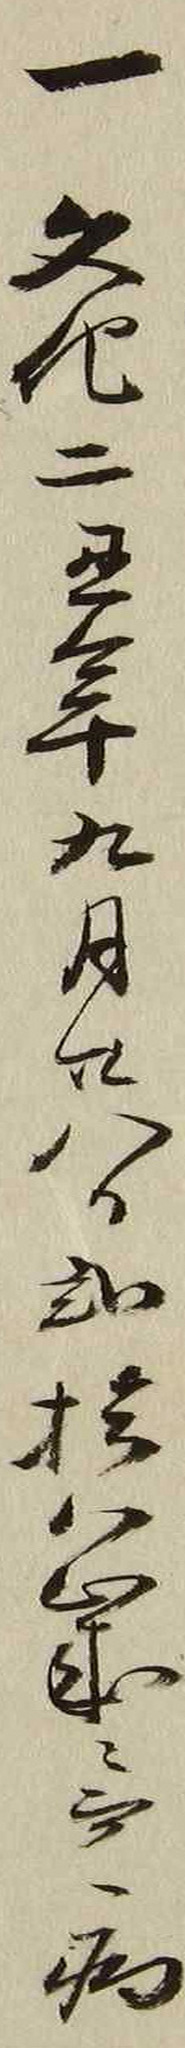一文化二丑年九月廿八日弐拾八歳ニ而病
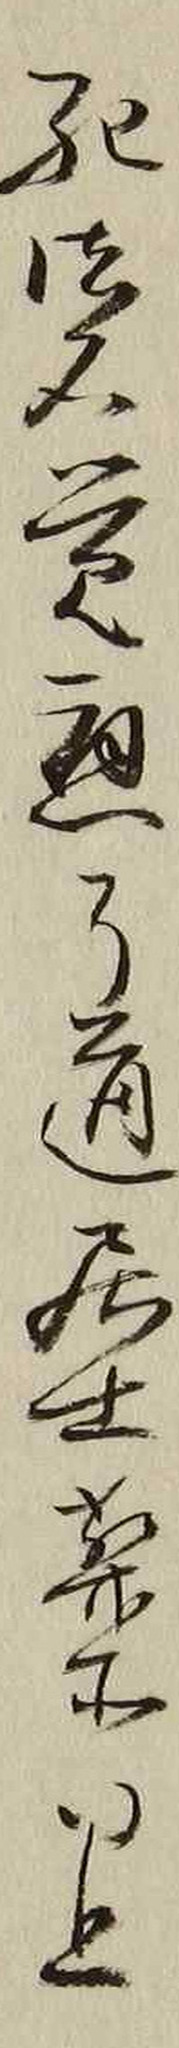死法名覚応了道居士葬所同上
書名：諸士系譜　巻之291　さ之部23
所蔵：会津若松市立会津図書館
